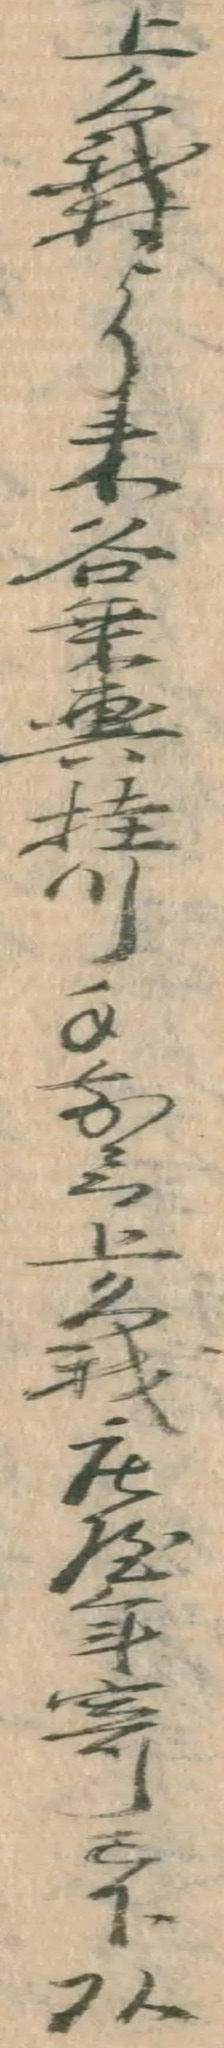上久我村より来名乗輿桂川手前に而上名我庄屋斗寄已下頭
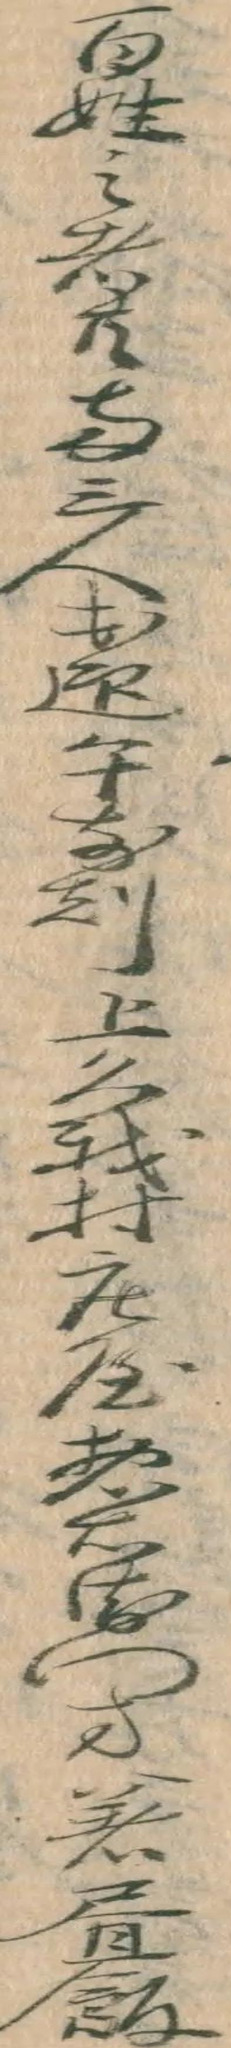百姓之者共両三人於迎午前刻上久我村庄屋惣右衛門方ヘ着昼飯
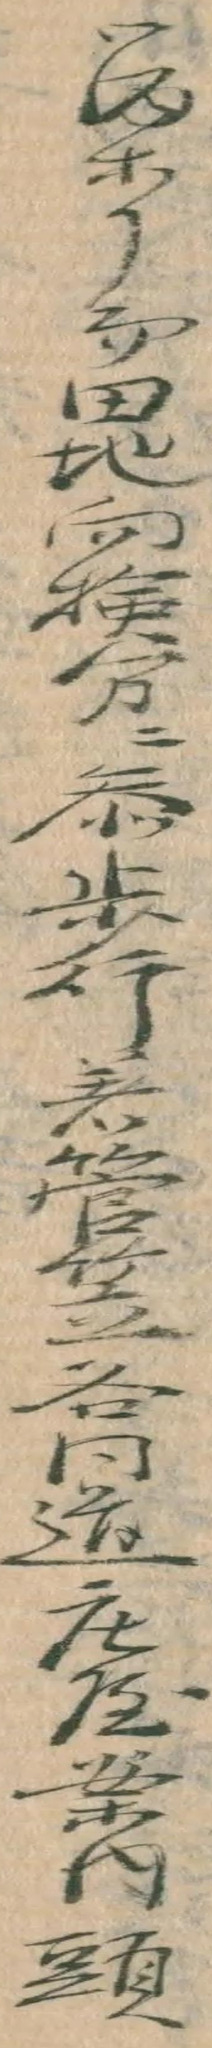御酒了而田地向検分ニ参歩行着管笠谷同道庄屋案内頭
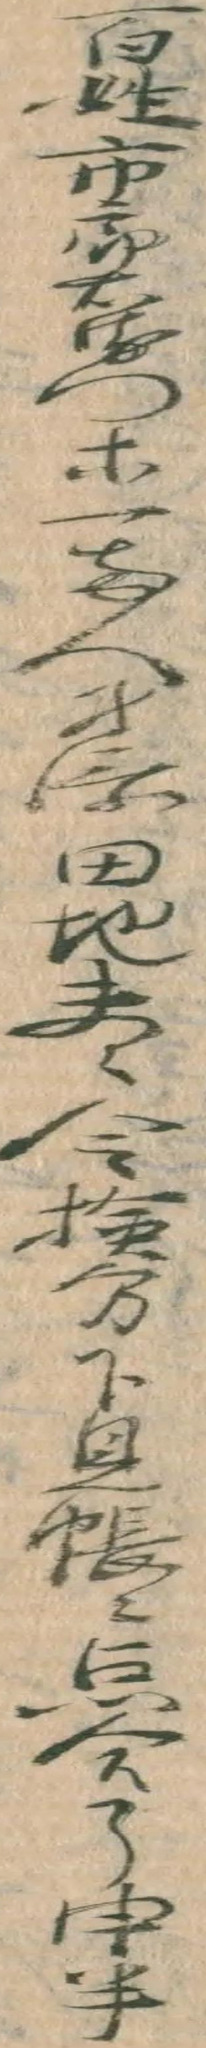百姓市郎右衛門等一両人付添田地夫々令検分下見帳ニ点合了申半
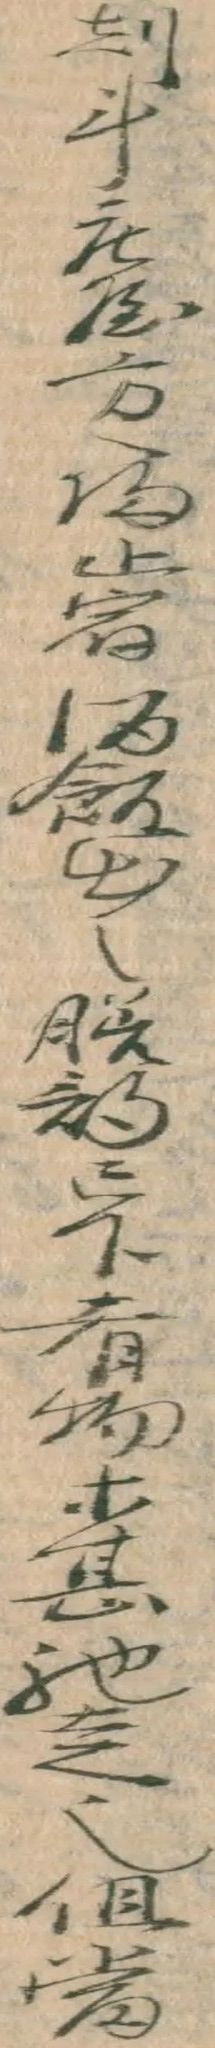刻斗庄屋方へ帰止宿酒飯出之膳部被下肴物等甚馳走也但當
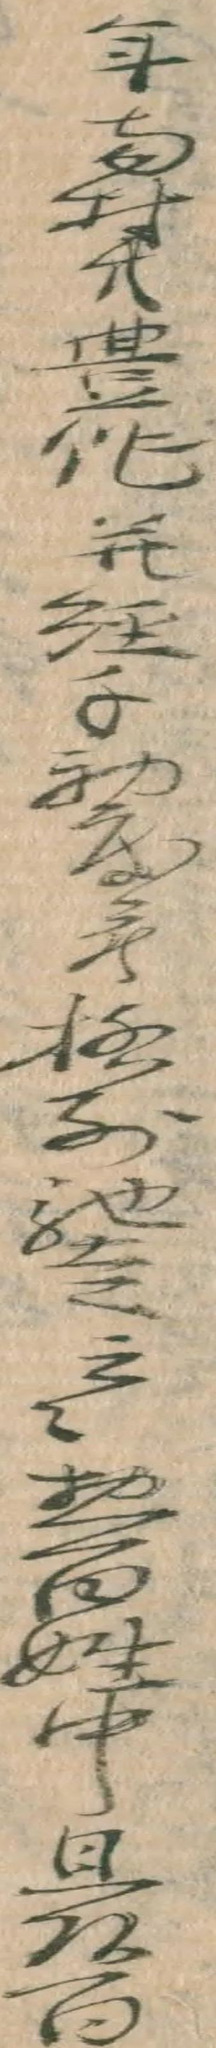年両村共豊作并経千初度ニ付格別馳走云々惣百姓中且頭百
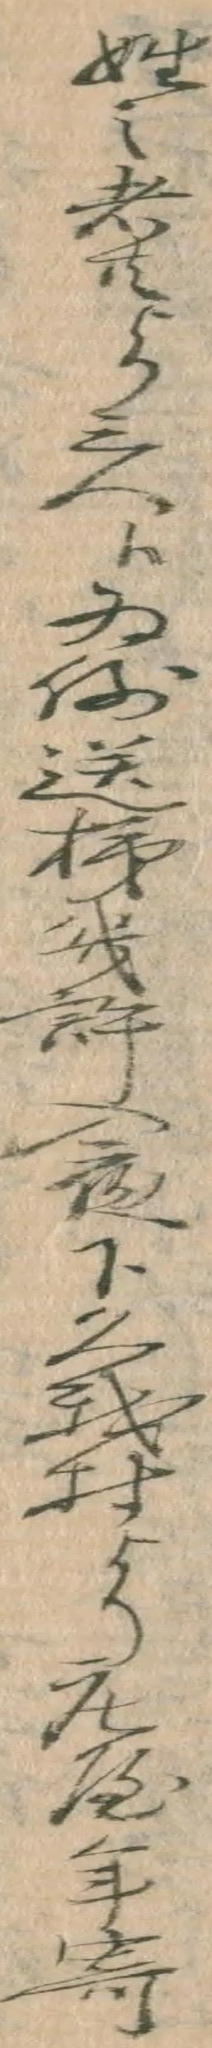姓之者共より三人え為例送柿幾許入夜下久我村より庄屋年寄
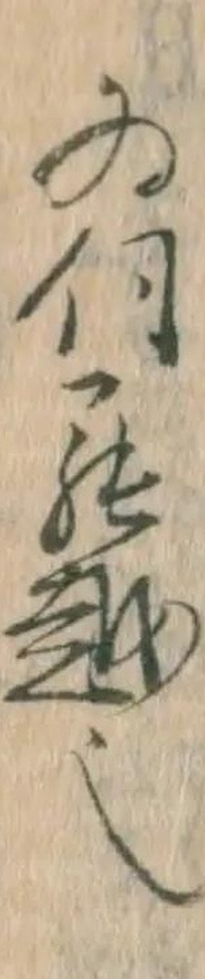為伺罷越也
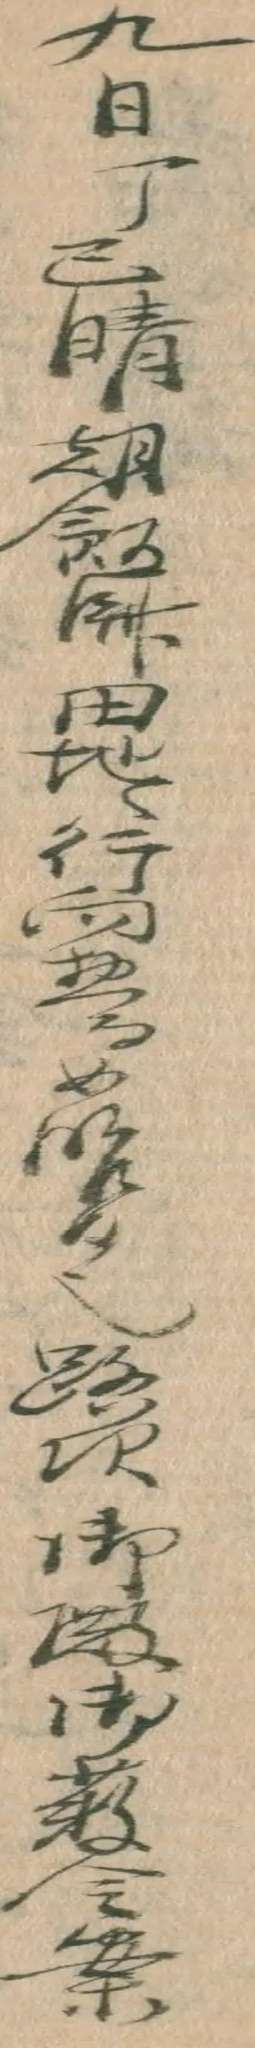九日丁巳晴朝飯済田地へ行向惣而如昨日也路次御殿御藪令案
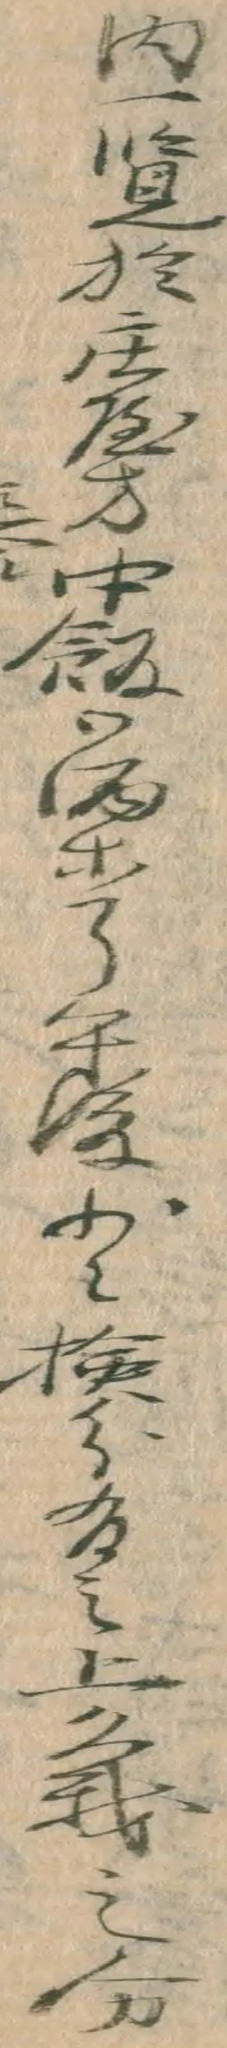内一覧於庄屋方中飯御酒等了午後少々検分有之上久我之分
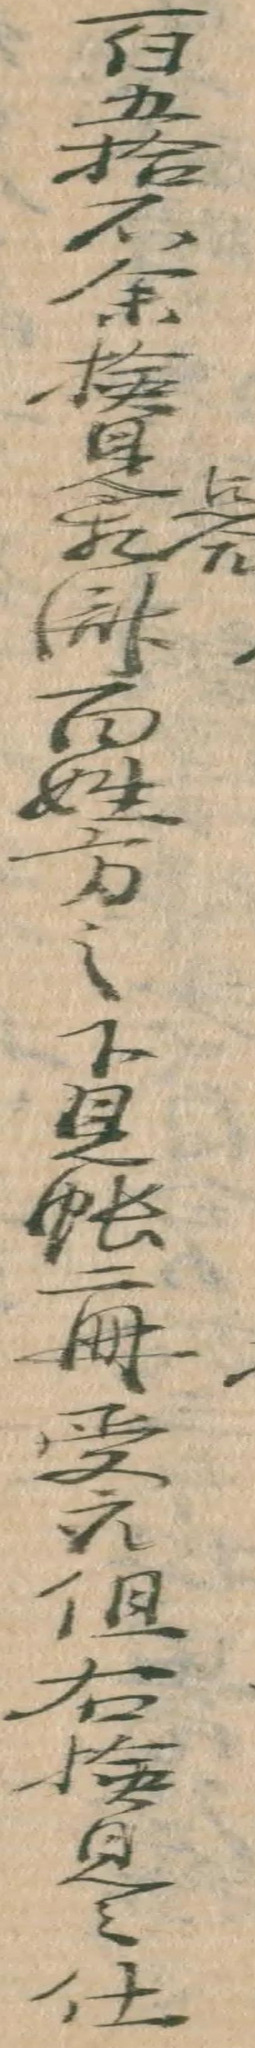百五拾石余検見点合相済百姓方之下見帳二冊受取但右検見之仕
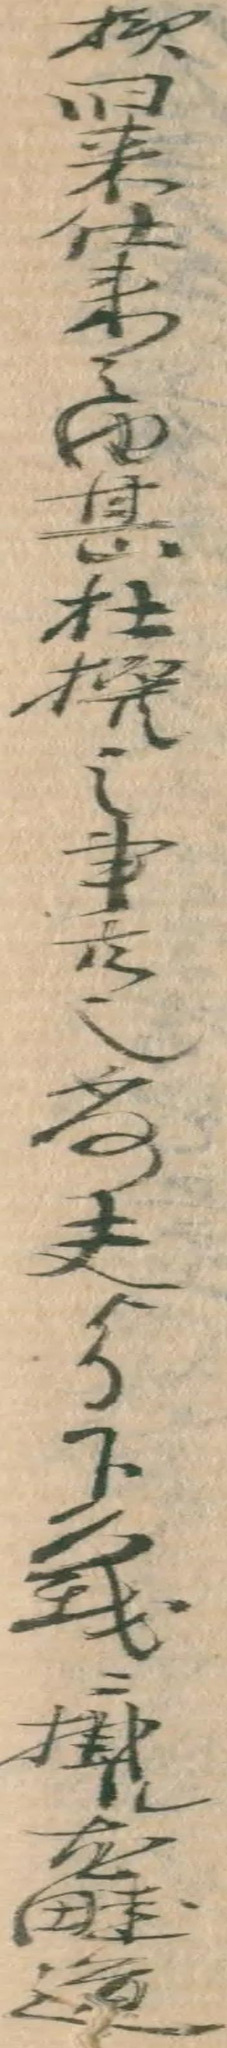様旧来仕来之由甚杜撰之事共也如何夫より下才判ニ掛ル尤畦道
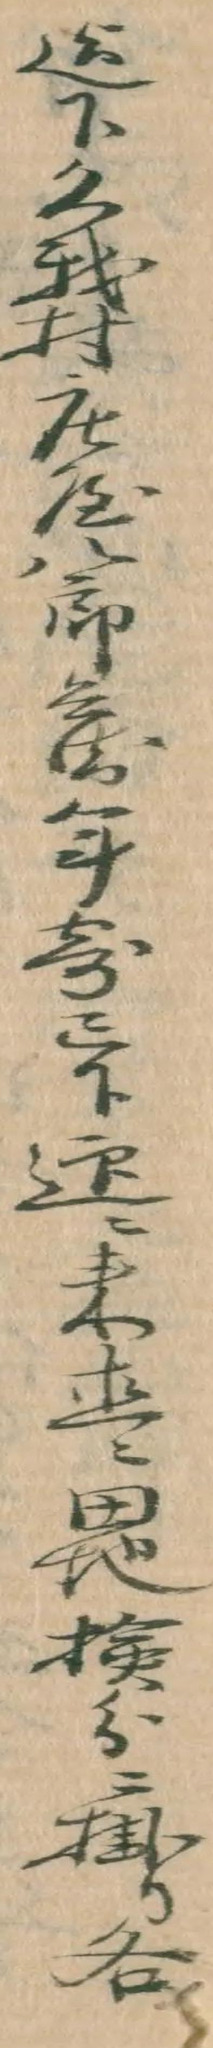迄下久我村庄屋八郎兵衛年寄已下迎ニ来直ニ田地検分ニ掛りリ各
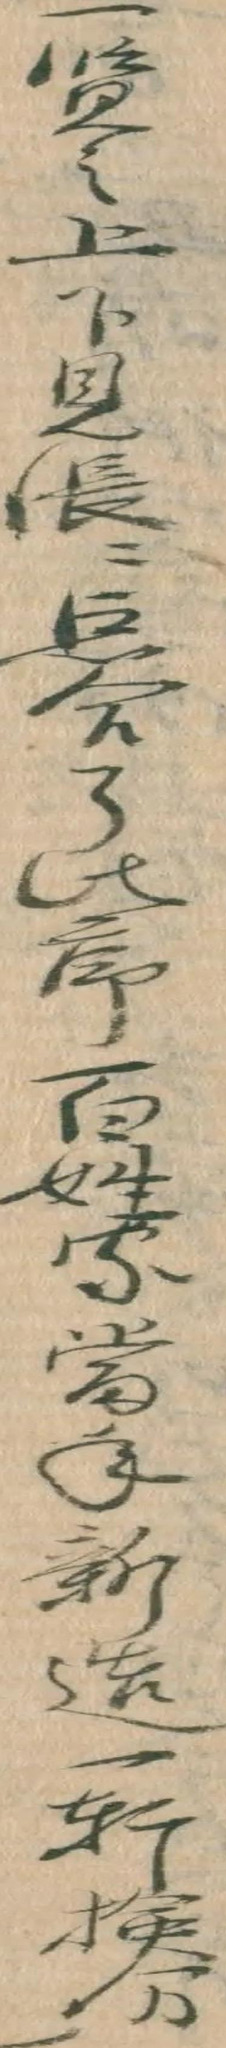一覧之上下見帳ニ見合了此序百姓家當年新造一軒検分
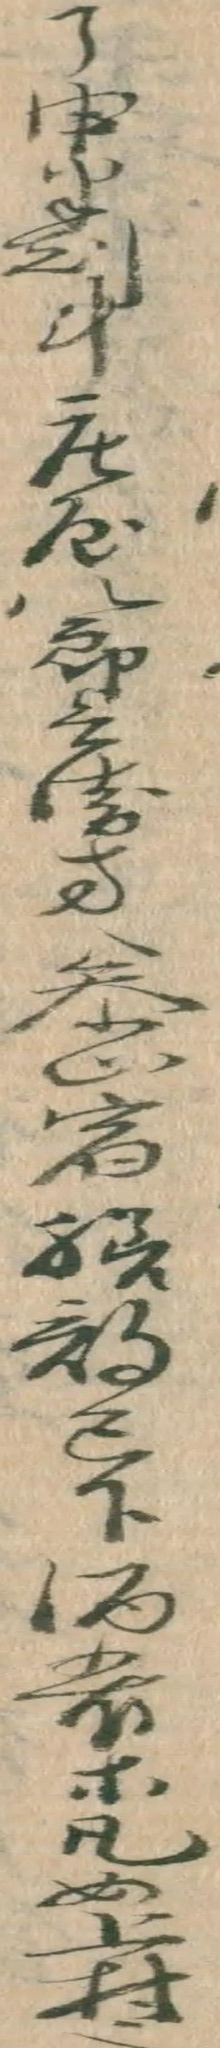了申半刻斗庄屋八郎兵衛方へ参止宿膳部已下酒肴等凡如上村也
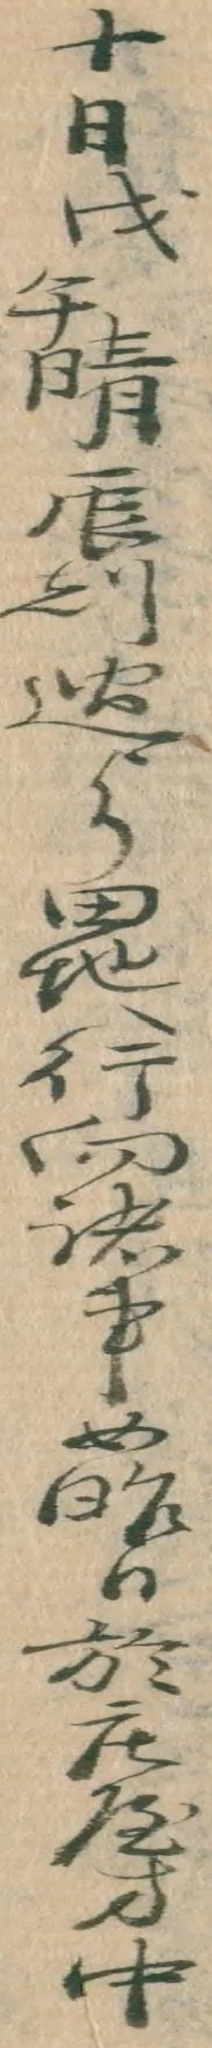十日戊午晴辰刻過より田地へ行向諸事如昨日於庄屋方中
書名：賀茂社記録. 第65冊
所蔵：国立国会図書館 National Diet Library, JAPAN
